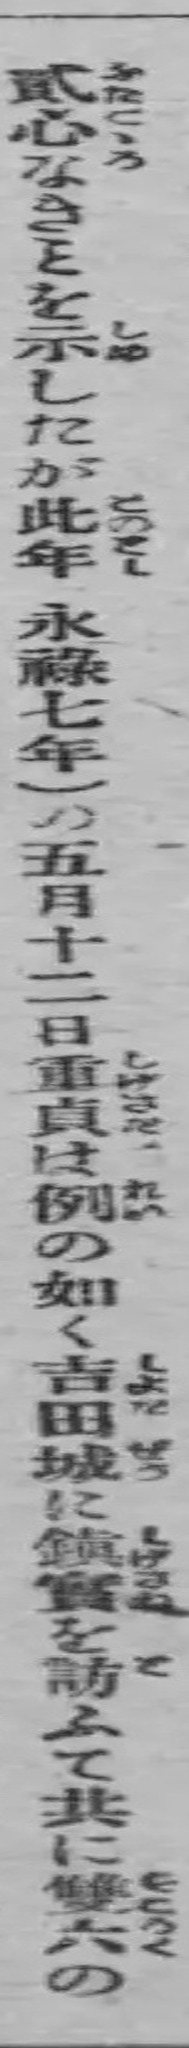弐心なきことを示したが此年(永禄七年)の五月十二日重定は例の如く吉田城に鎮実を訪ふて共に双六の
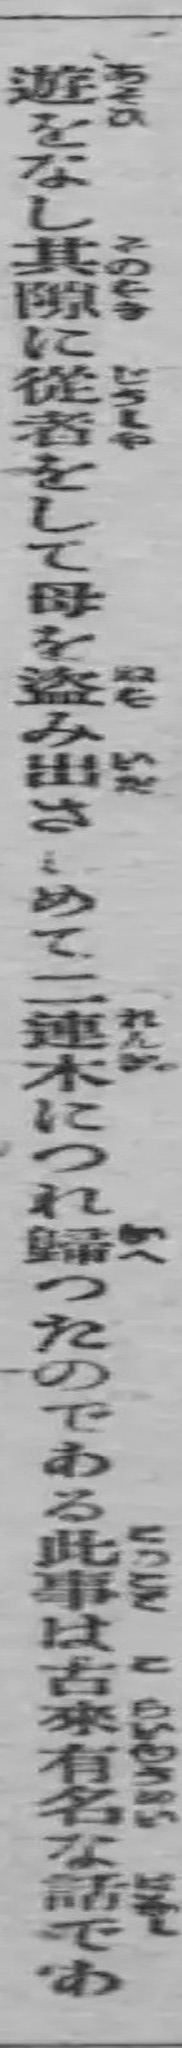遊をなし其隙に従者をして母を盗み出さしめて二連木につれ帰つたのである此事は古来有名な話であ
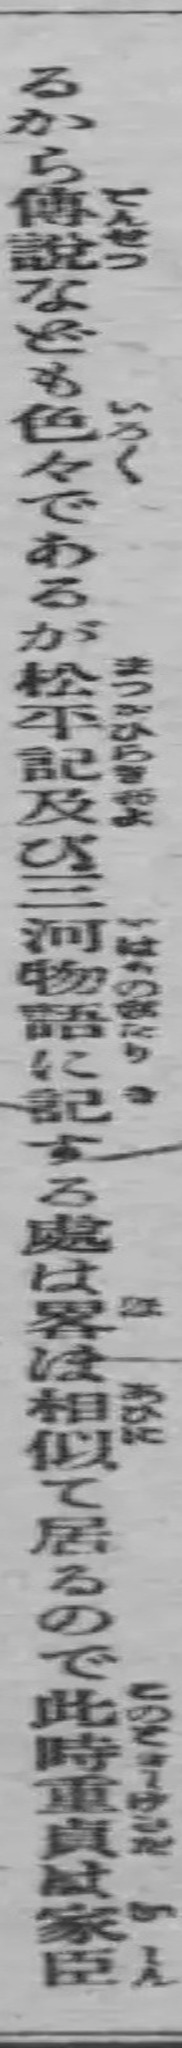るから伝説なども色々であるが松平記及び三河物語に記する処は略ほ相似て居るので此時重定は家臣
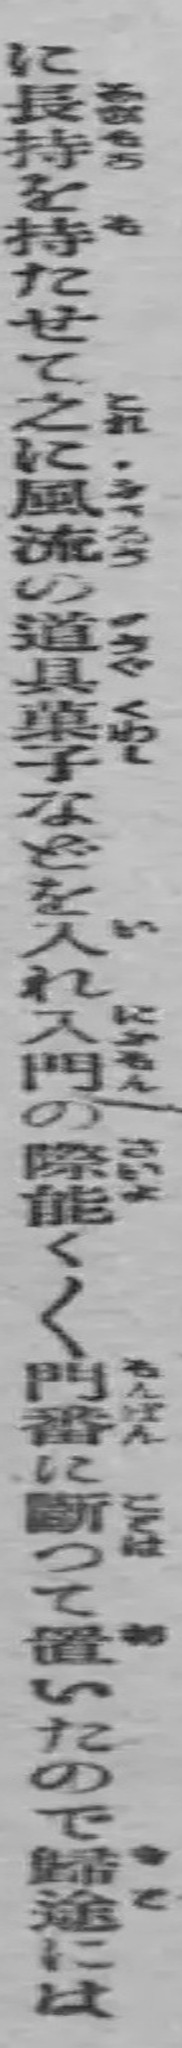に長持を持たせて之に風流の道具菓子などを入れ入門の際能く〳〵門番に断つて置いたので帰途には
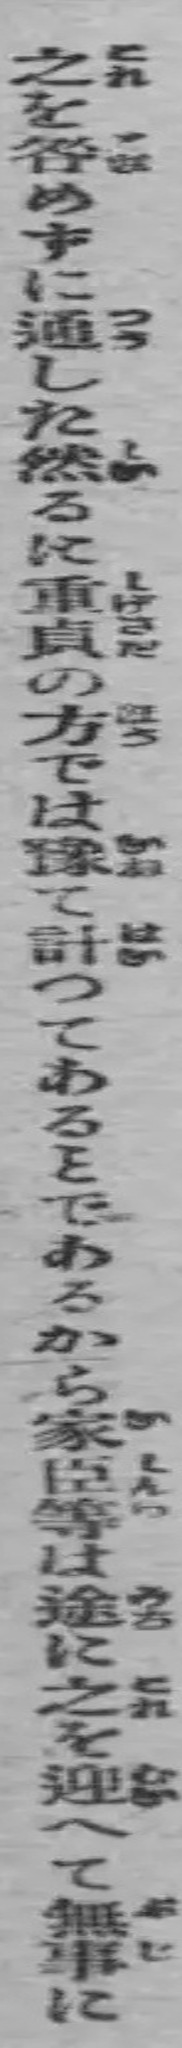之を咎めず通した然るに重定の方では予て計つてあることであるから家臣等は途に之を迎へて無事に

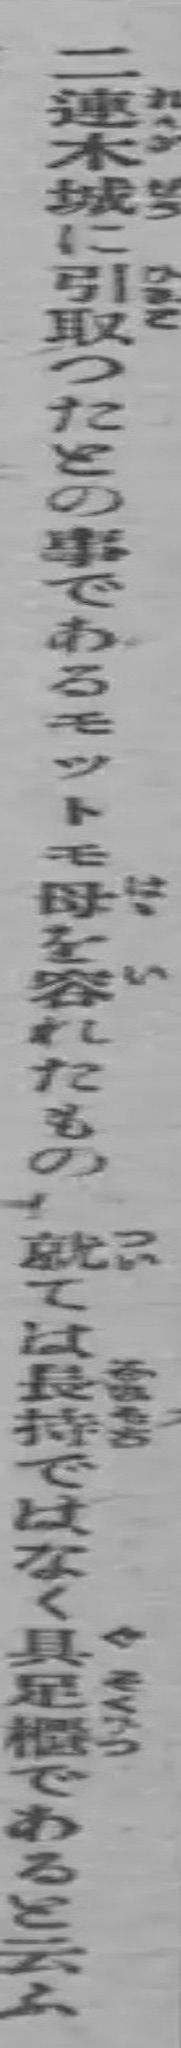二連木城に引取つたとの事であるモツトモ母を容れたものに就ては長持ではなく具足櫃であると云ふ
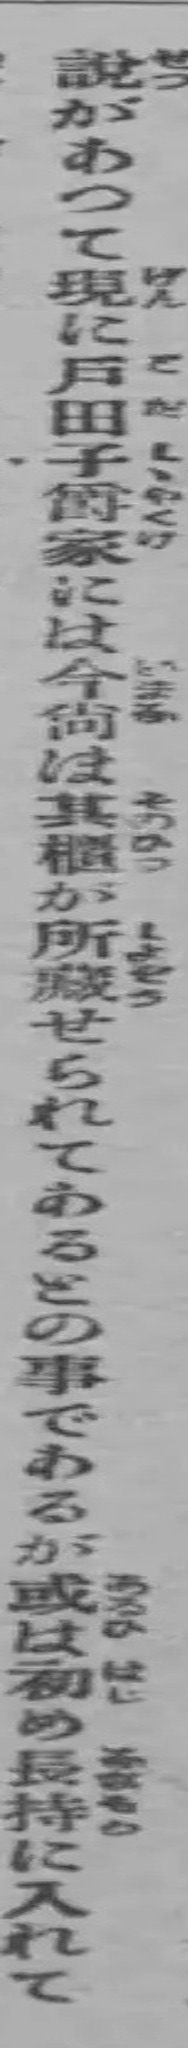説があつて現に戸田子爵家には今尚ほ其櫃が所蔵せられてあるとの事であるが或は初め長持に入れて
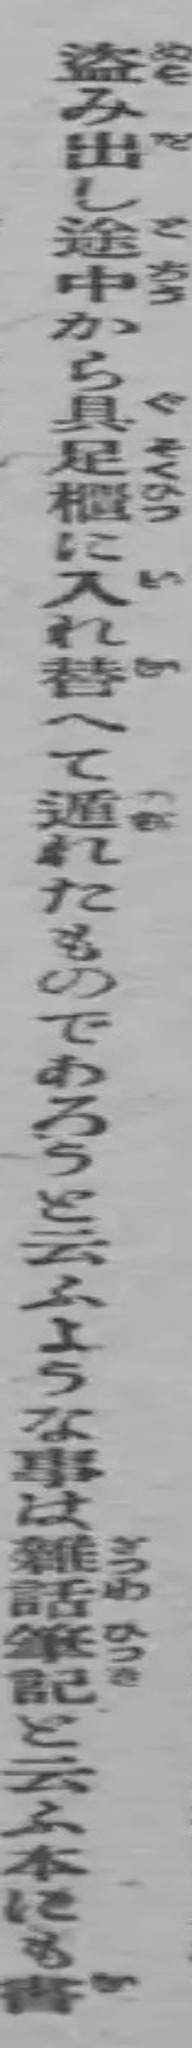盗み出し途中から具足櫃に入れ替へて遁れたものであろうと云ふような事は雑話筆記と云ふ本にも書
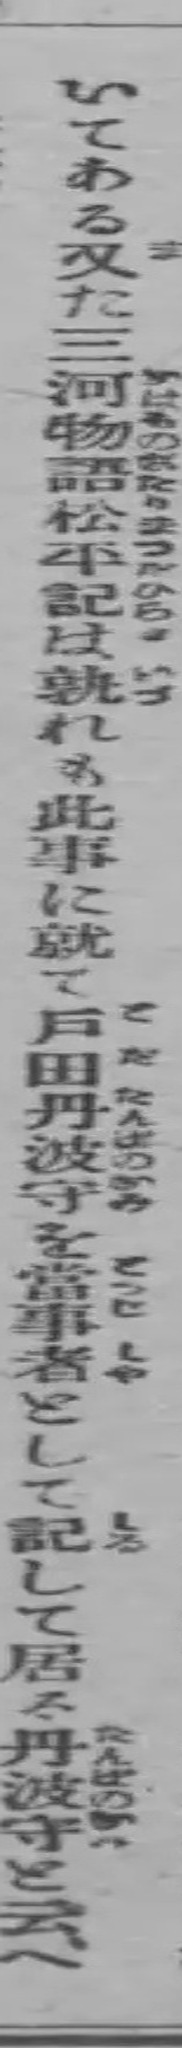いてある又た三河物語松平記は孰れも此事に就て戸田丹波守を当事者として記して居る丹波守と云へ
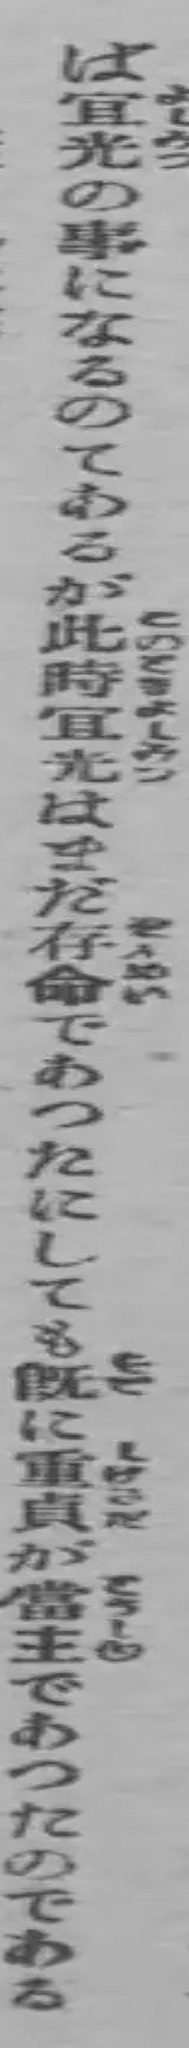ば宜光の事になるのてあるが此時宜光はまだ存命であつたにしても既に重貞が当主であつたのである
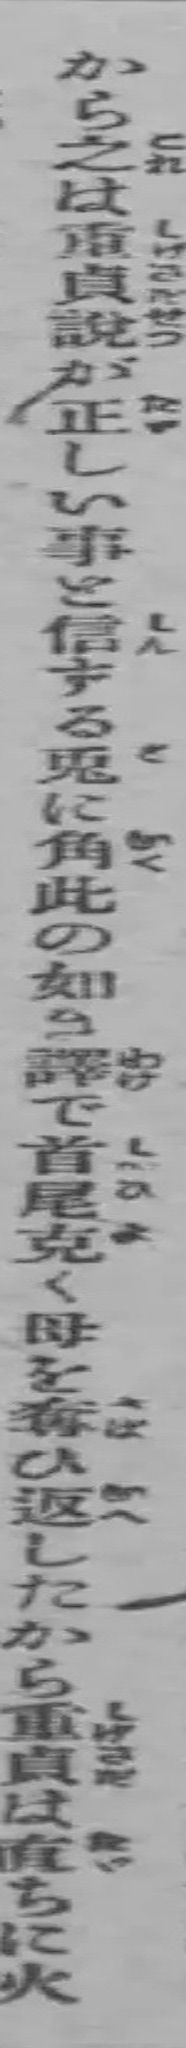から之は重貞説が正しい事と信ずる兎に角此の如き訳で首尾克くは母を奪ひ返したから重貞は直ちに火
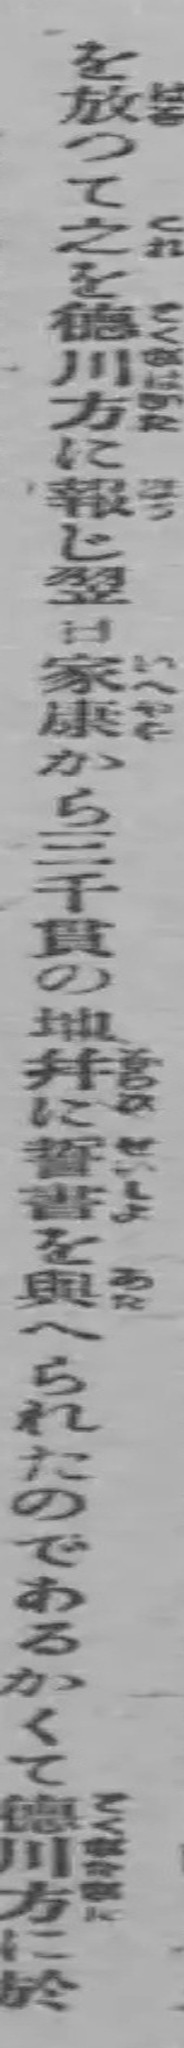を放つて之を徳川方に報じ翌日家康から三千貫の地幷に誓書を与へられたのであるかくて徳川方に於
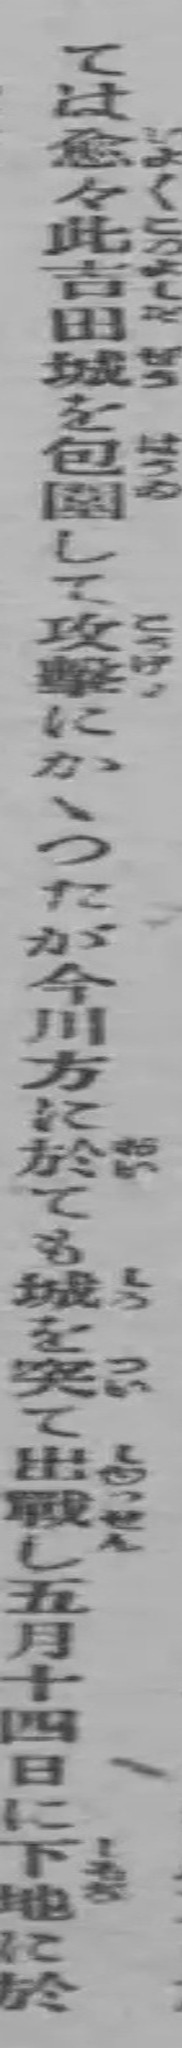ては愈々此吉田城を包囲して攻撃にかゝつたが今川方に於ても城を突て出戦し五月十四日に下地に於
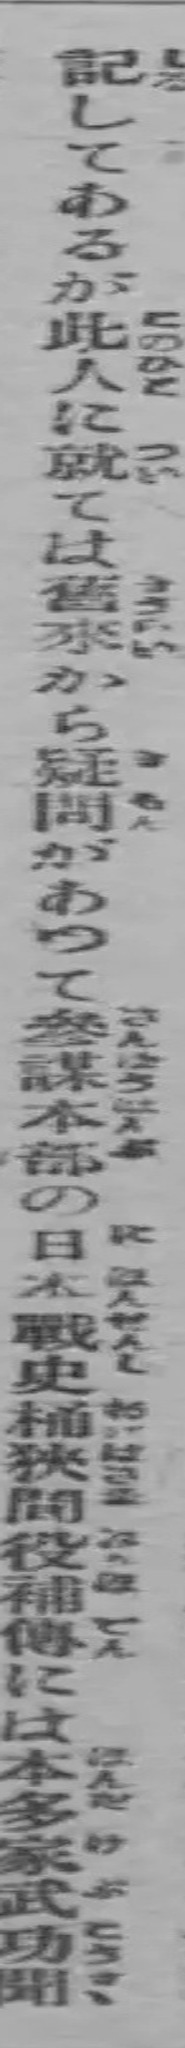記してあるが此人に就ては旧来から疑問があつて参謀本部の日本戦史桶狭間役補伝には本多家武功聞
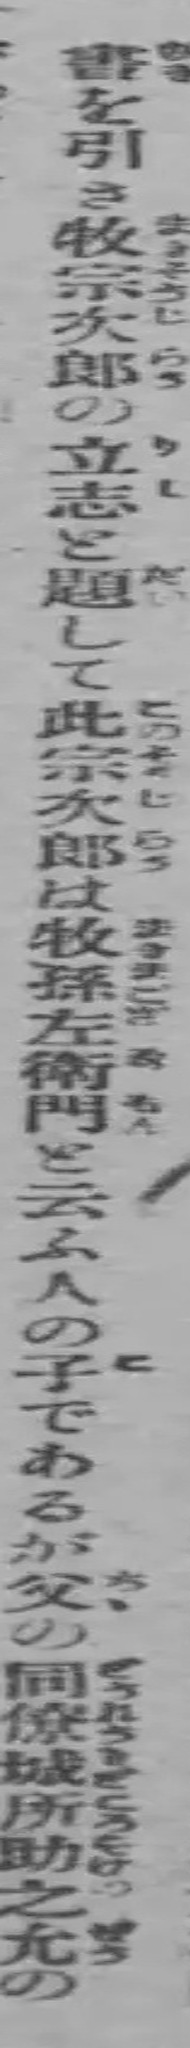書を引き牧宗次郎の立志と題して此宗次郎は牧孫左衛門と云ふ人の子であるが父の同僚城所助之允の
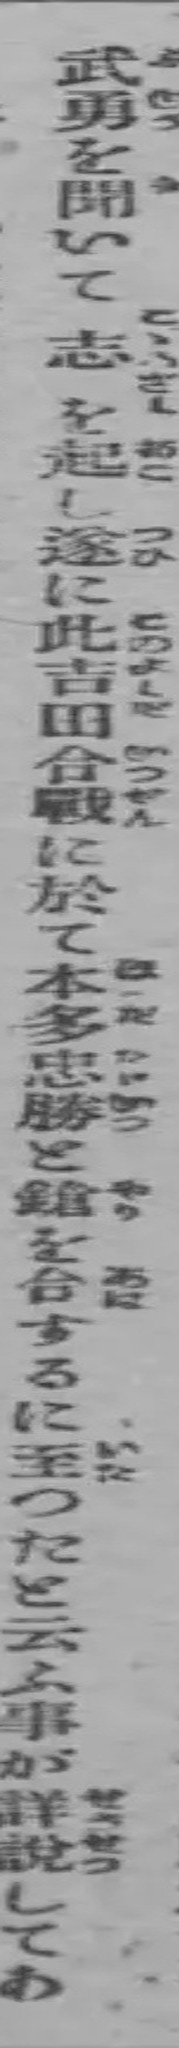武勇を聞いて志を起して遂に此吉田合戦に於て本多忠勝と鎗を合するに至つたと云ふ事が詳説してあ
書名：豊橋市史談
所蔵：国立国会図書館 National Diet Library, JAPAN
